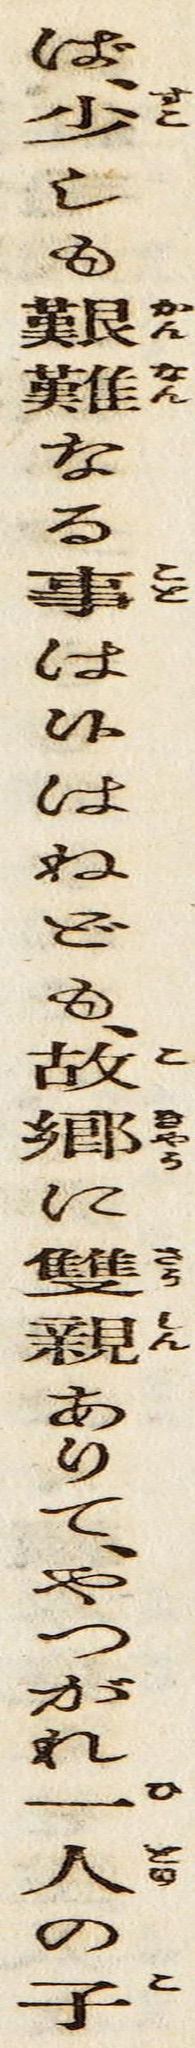ば、少しも艱難なる事は候はねども、故郷に双親ありて、やつがれ一人の子
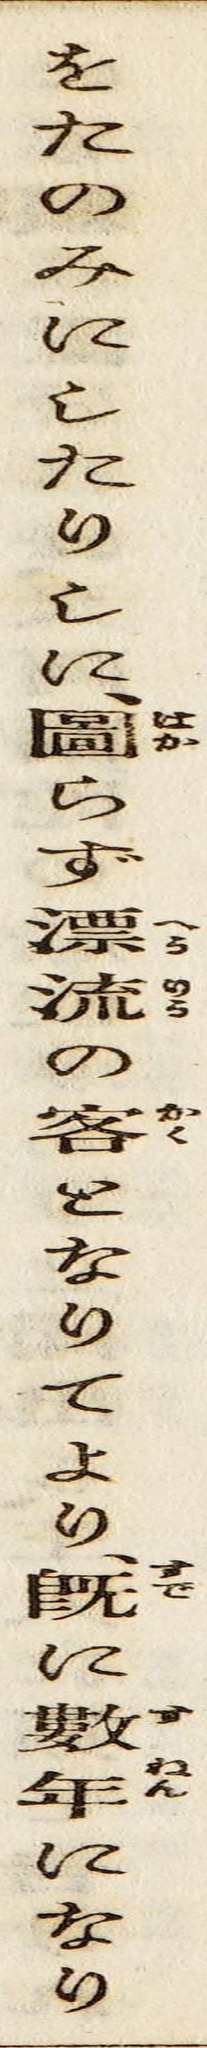をたのみにしたりしに、図らず漂流の客となりてより、既に数年になり
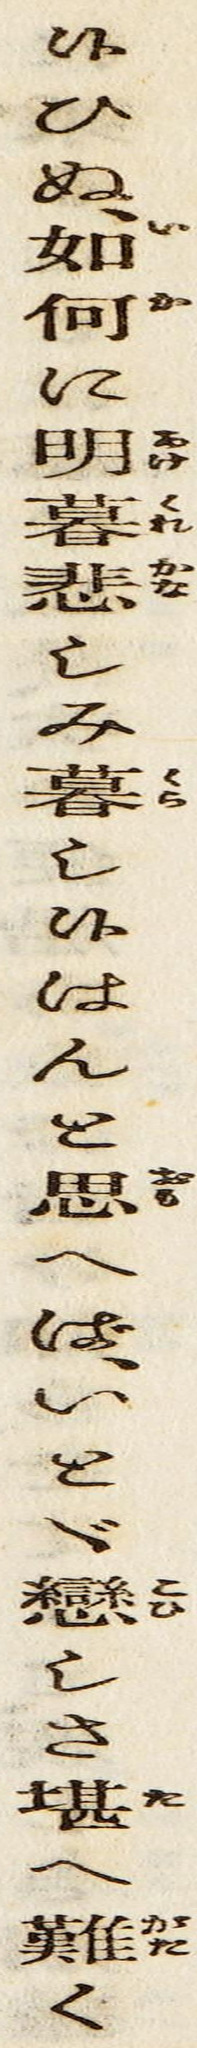候ひぬ、如何に明暮悲しみ暮し候はんと思へば、いとヾ恋しさ堪へ難く
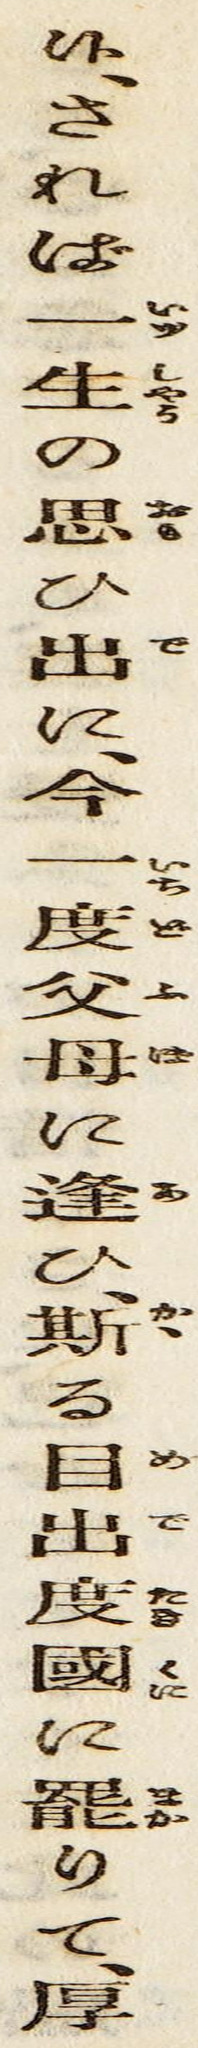候、されば一生の思ひ出に、今一度父母に逢ひ、斯る目出度国に罷りて、厚
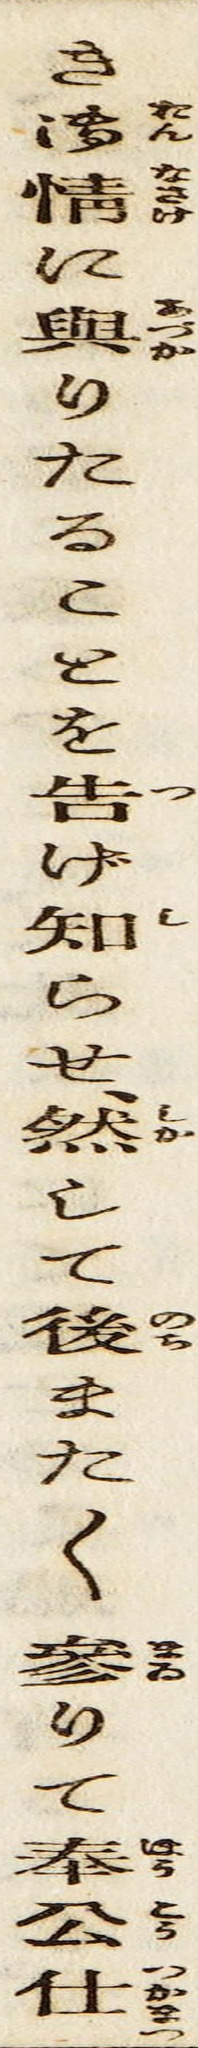き御情に与りたることを告げ知らせ、然して後また〳〵参りて奉公仕
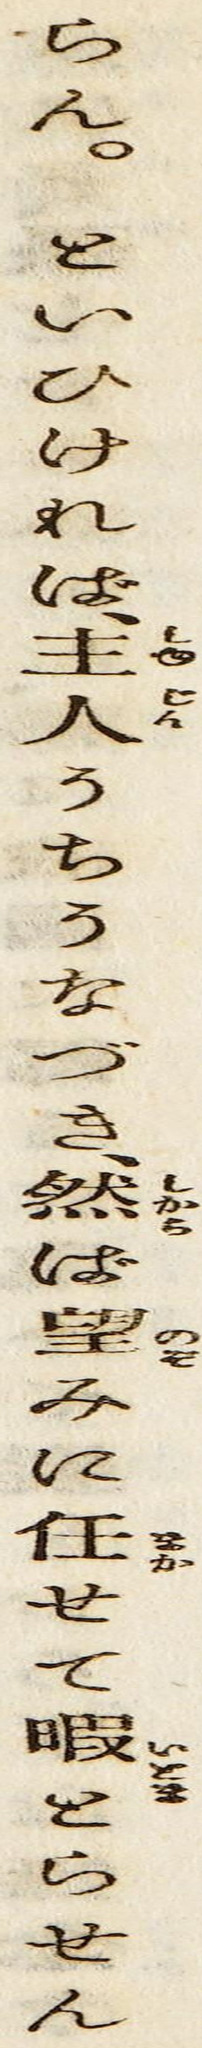らん。といひければ、主人うちうなづき、然ば望みに任せて暇とらせん
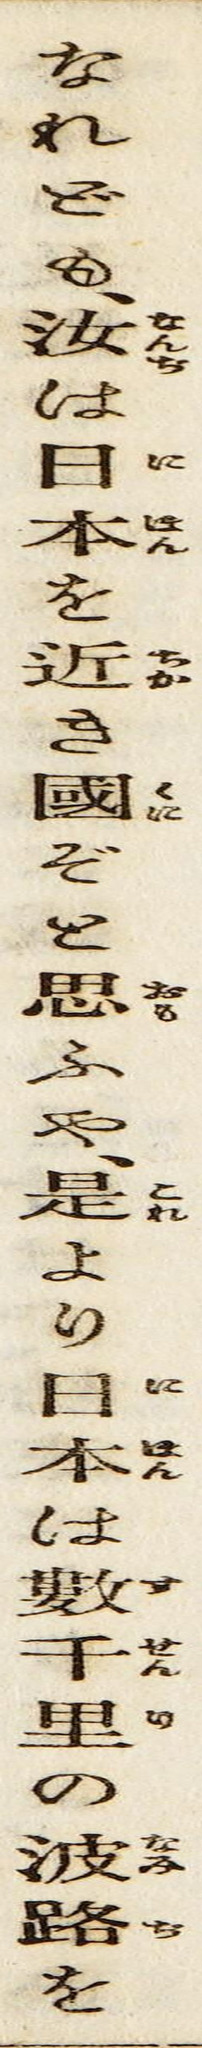なれども、汝は日本を近き国ぞと思ふや、是より日本は数千里の波路を
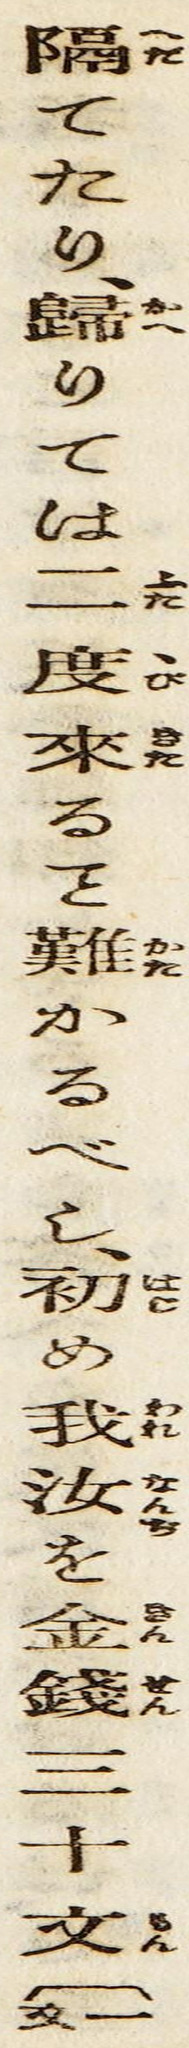隔てたり、帰りては二度来ること難かるべし、初め我汝を金銭三十文[一文
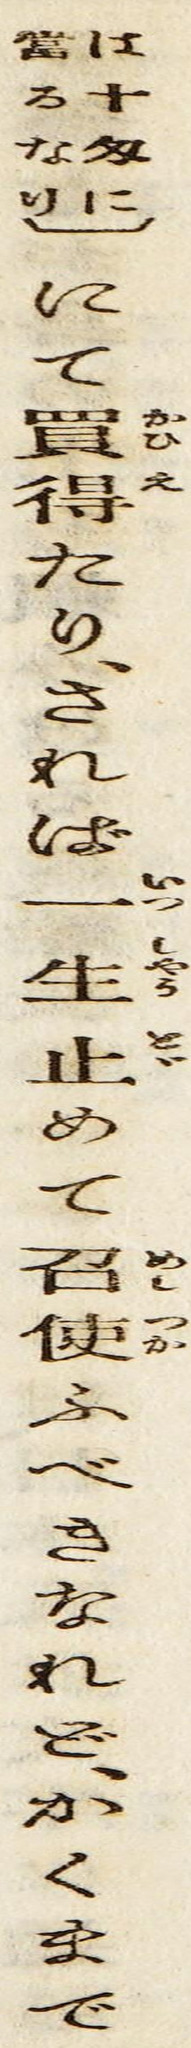は十匁に当るなり]にて買得たり。されば一生止めて召使ふべきなれど、かくまで
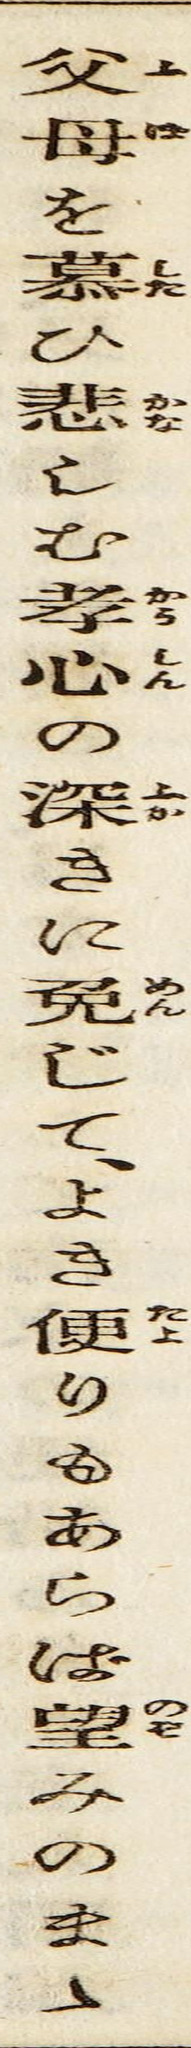父母を慕ひ悲しむ孝心の深きに免じて、よき便りもあらば望みのまゝ
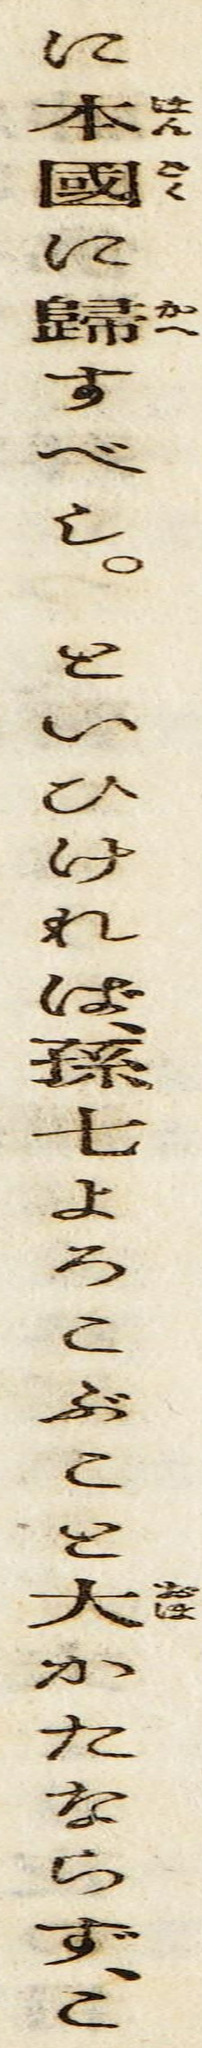に本国に帰すべし。といひければ、孫七よろこぶこと大かたならず、こ
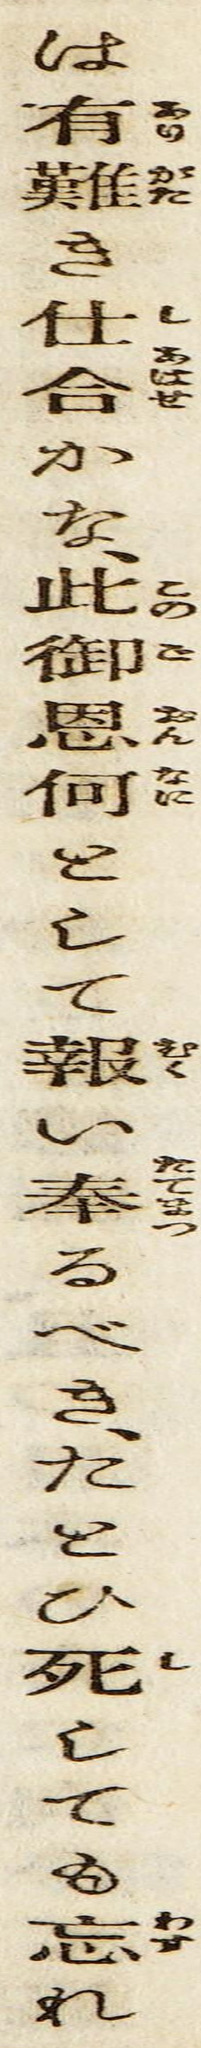は有難き仕合かな、此御恩何として報い奉るべき、たとひ死しても忘れ

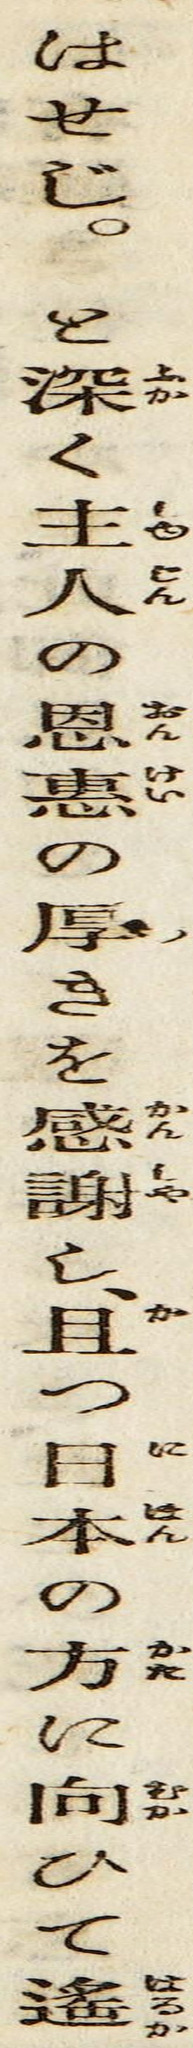はせじ。と深く主人の恩恵の厚きを感謝し、且つ日本の方に向ひて遥
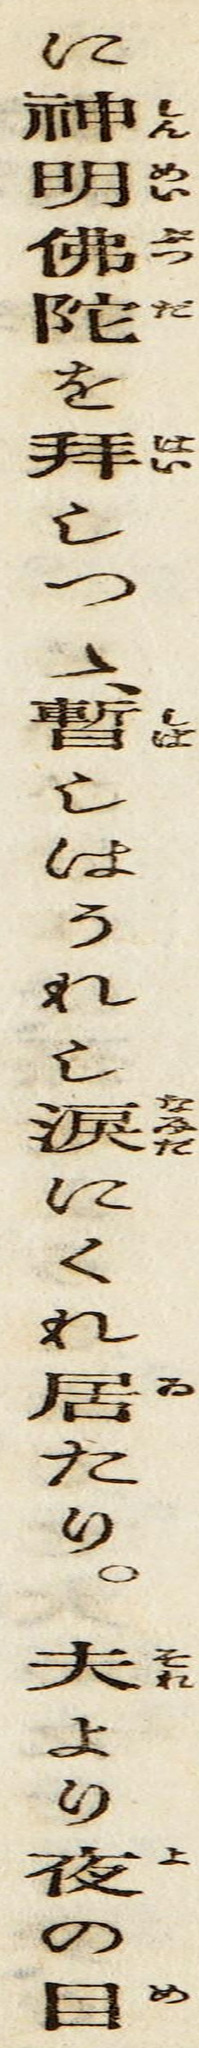に神明仏陀を拝しつゝ、暫しはうれし涙にくれ居たり。夫より夜の目
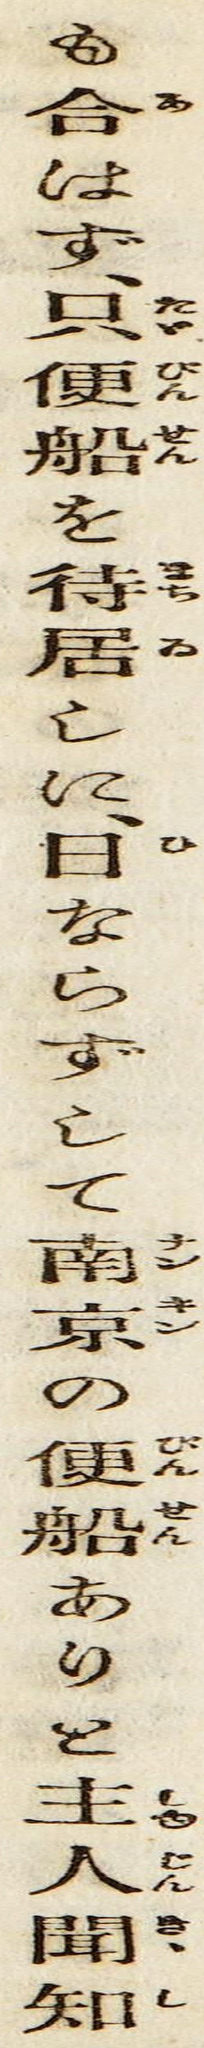も合はず、只便船を待居しに、日ならずして南京の便船ありと主人聞知
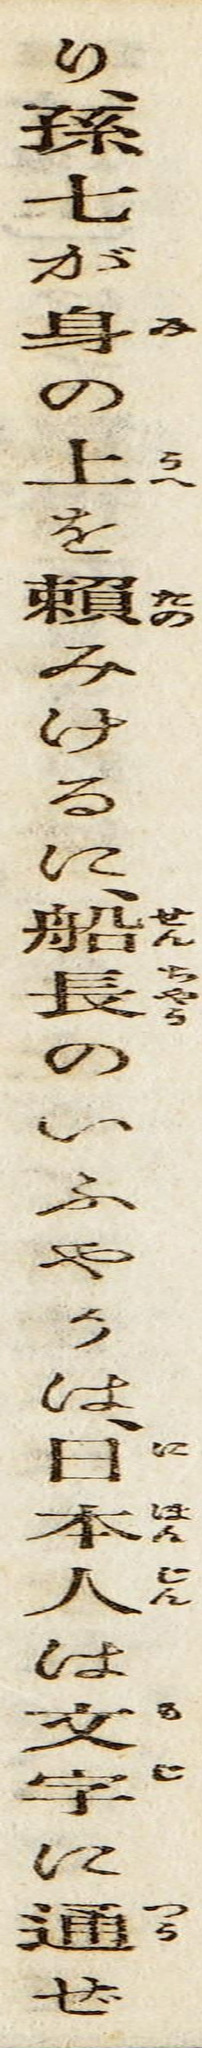り、孫七が身の上を頼みけるに、船長のいふやうは、日本人は文字に通ぜ
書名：日本漂流譚
